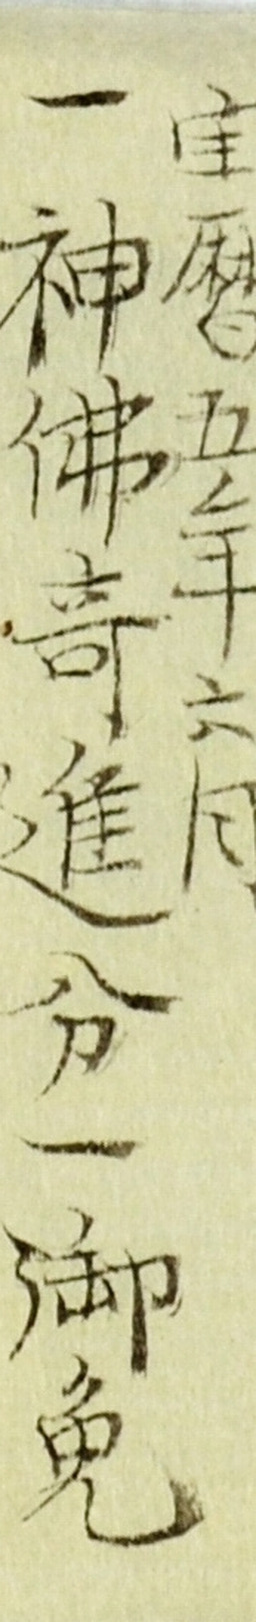一神仏寄進分一御免
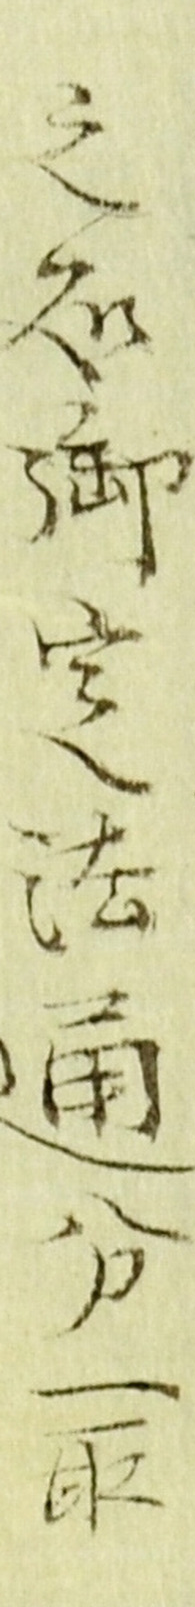之処御定法通分一所
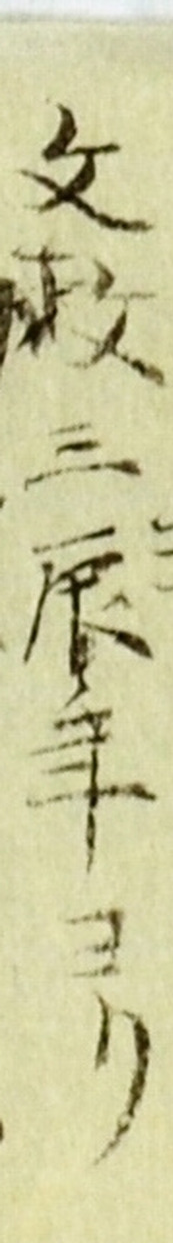文政三辰年ヨリ
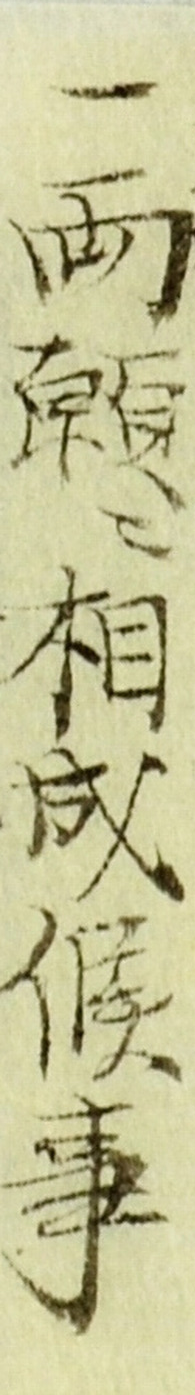一両願ニ相成候事
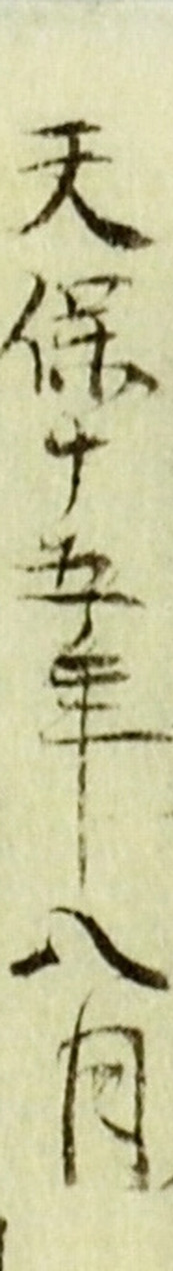天保十五年八月
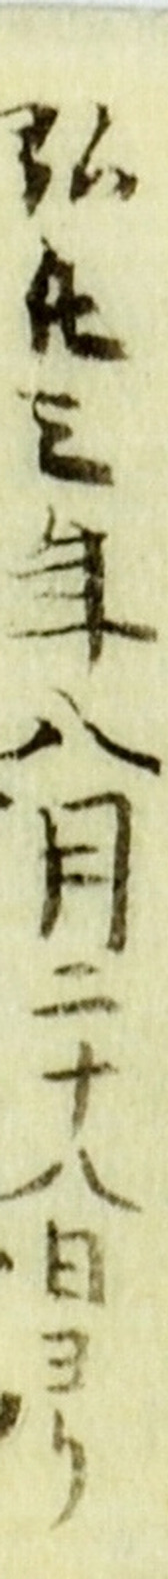弘化三年八月二十八日ヨリ
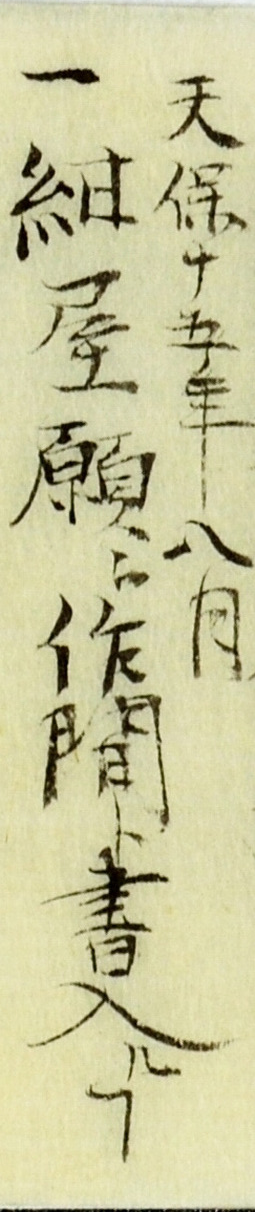一紺屋願而作間ト書入ル事
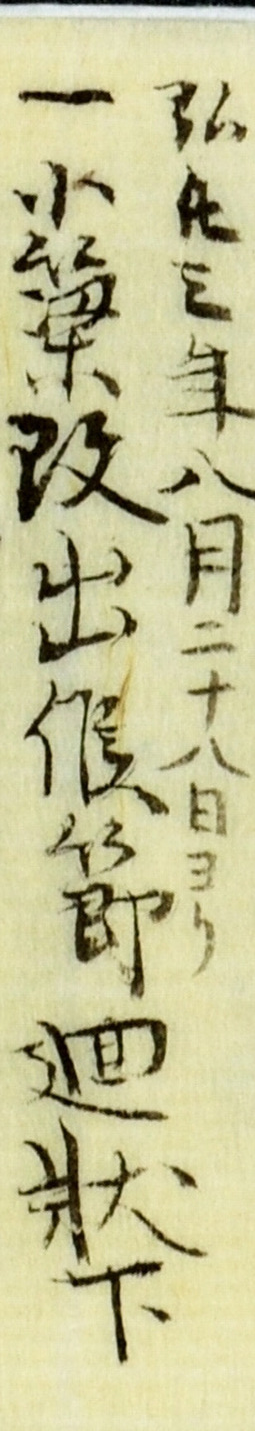一小簗改出候節廻状下
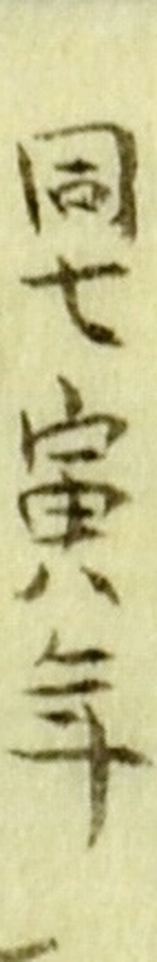同七寅年
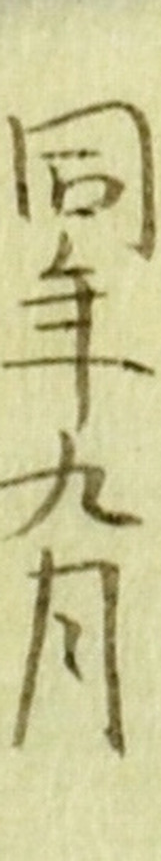同年九月
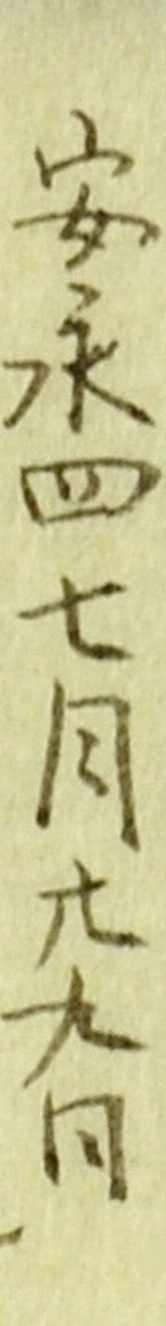安永四七月廿九日
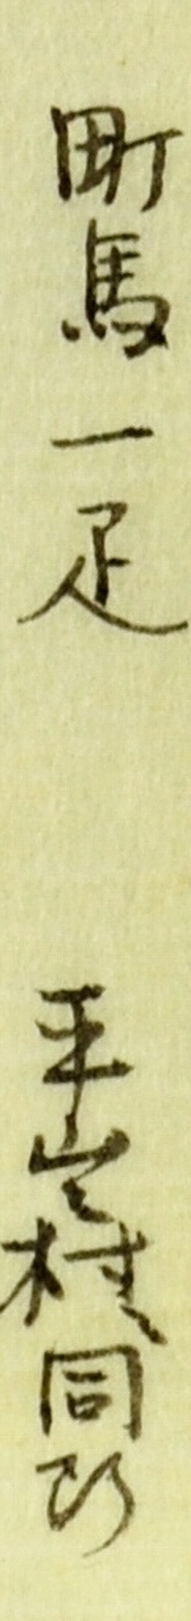町馬一疋平出村ニ同断
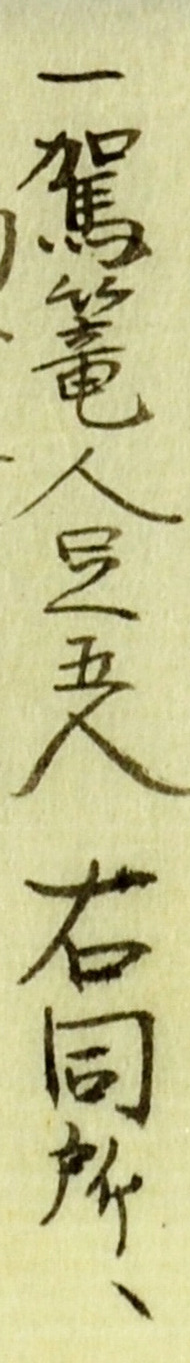一駕篭人足五人右同所ヘ
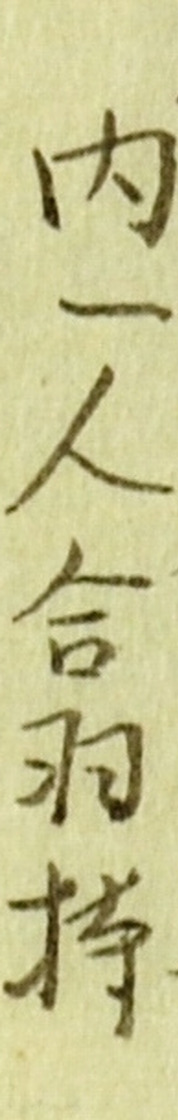内一人合羽持
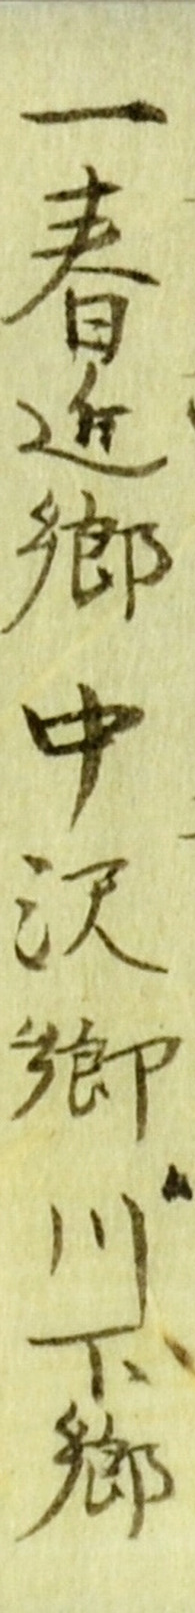一春近郷中沢郷川下郷
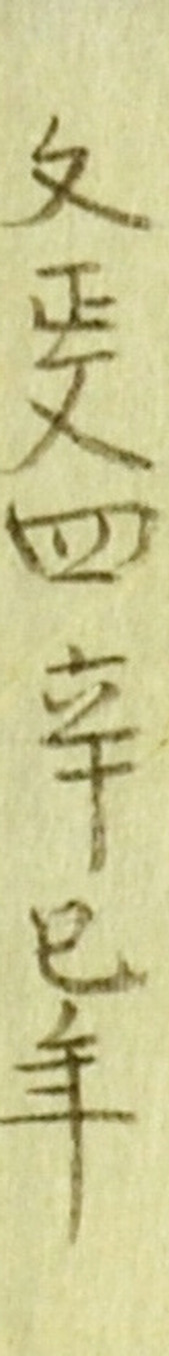文政四辛巳年
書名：分一御定法
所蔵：伊那市立高遠町図書館・合同会社AMANE
